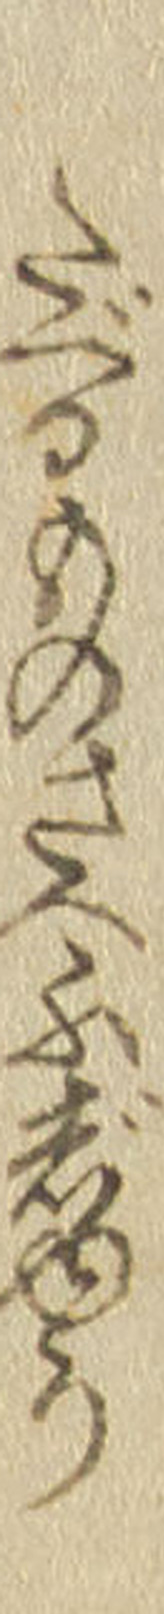たべるものさへふじゆう
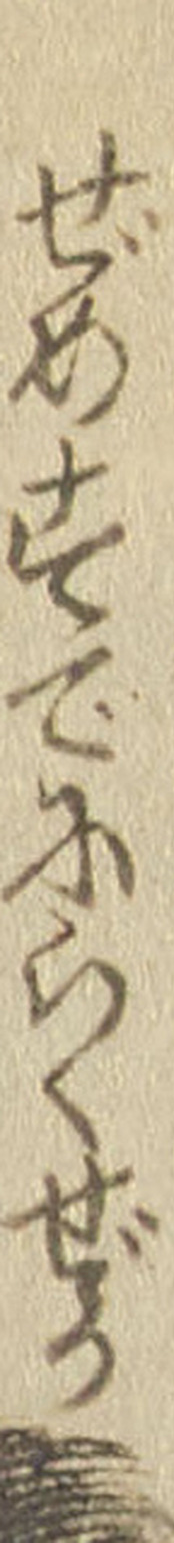ぜめすでにらくぜう
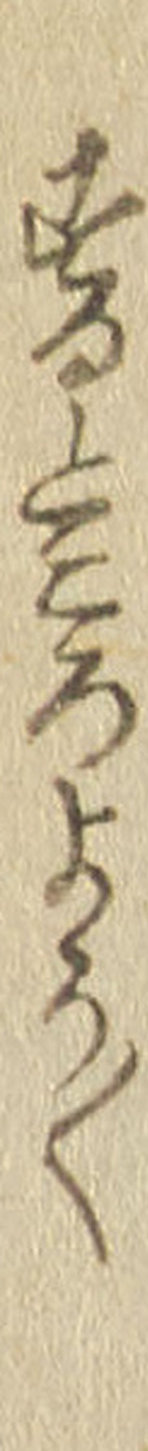するところよう〳〵
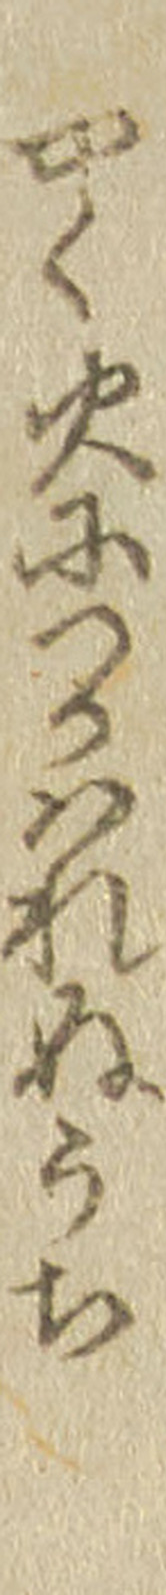やく火につかはれぬうち
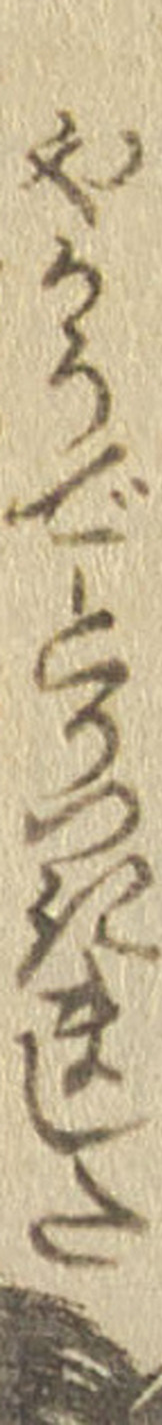やかうでとりつきました
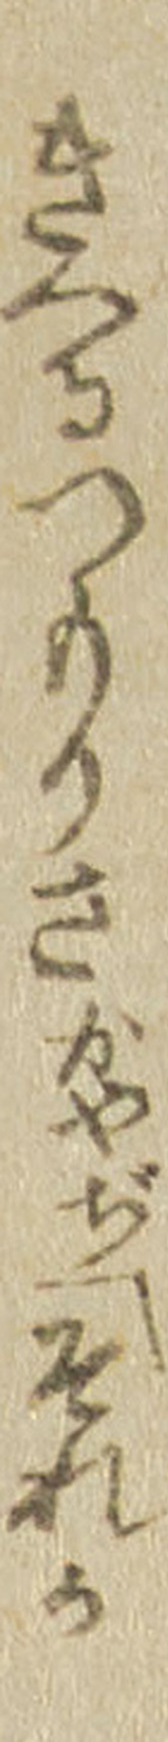きへるつもりさおやぢ「それが
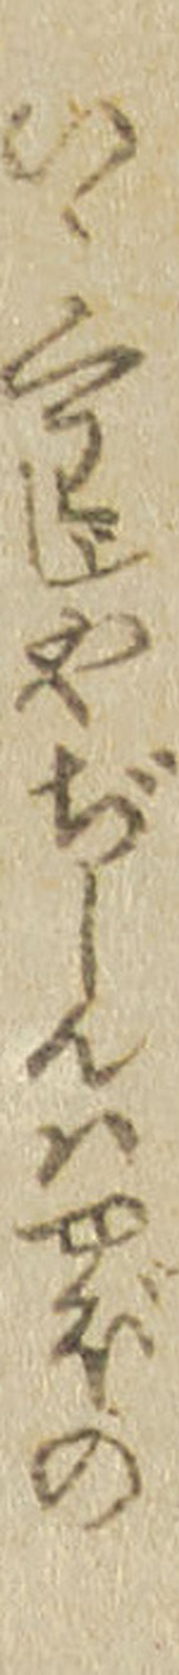いゝくわじやぢしんはやぼの
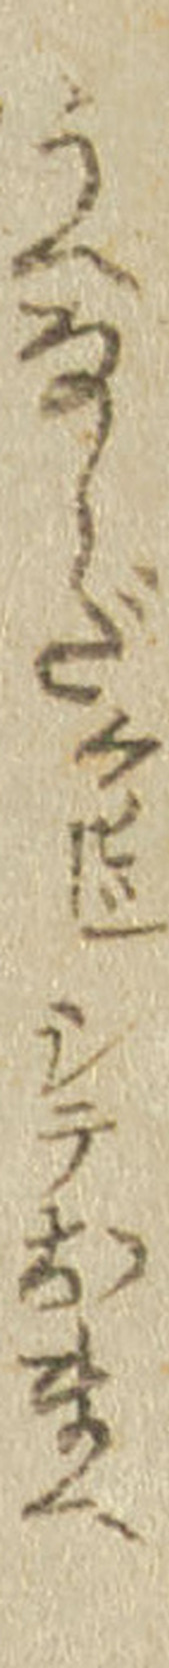うへなしだくわじしておまへ
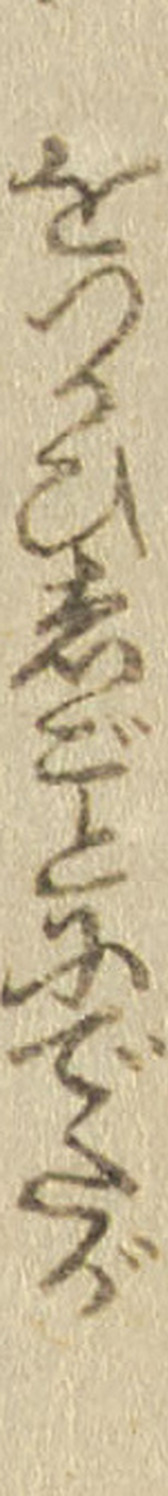をつかひしごとにでたが
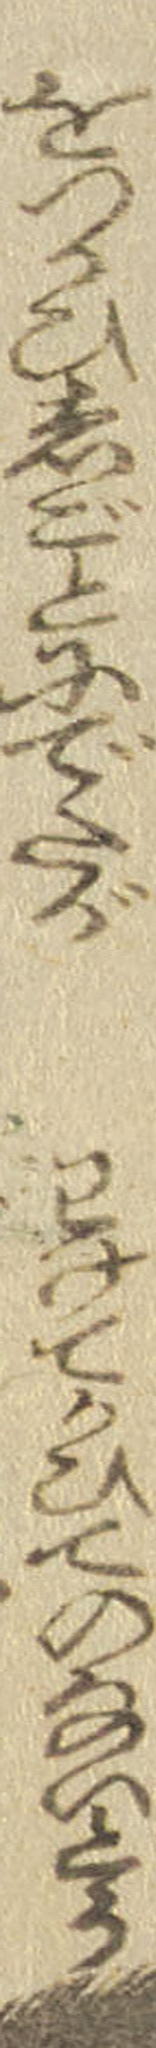をつかひしごとにでたが
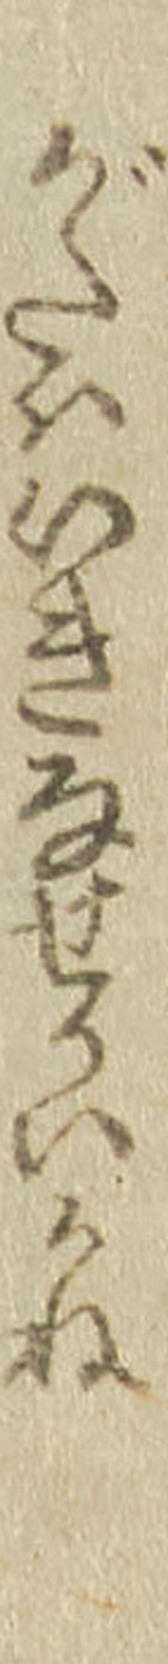がたはいきなせかいかね
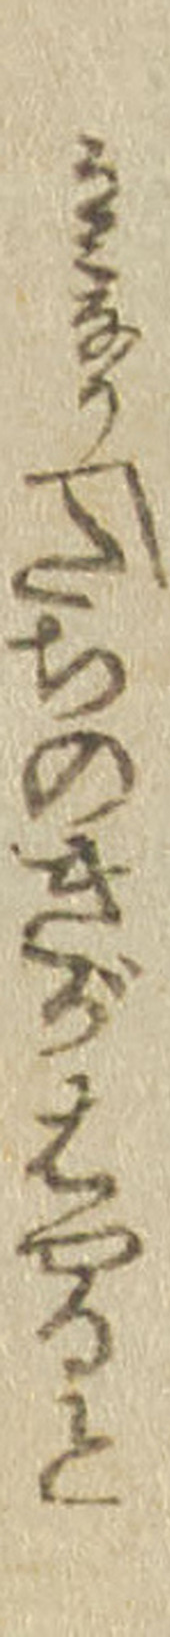かみなり「たちのきがはやると
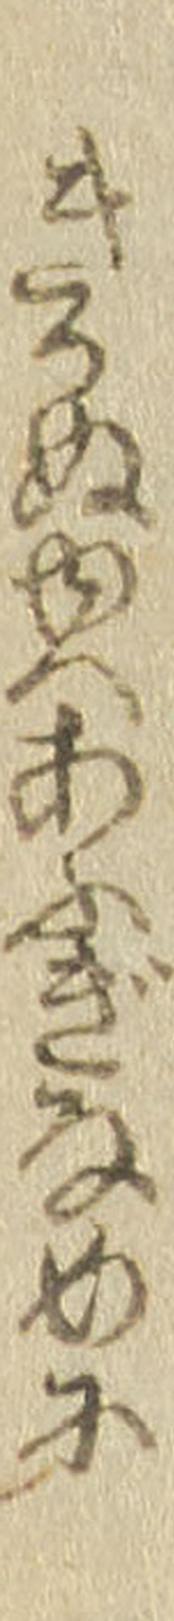きかぬゆへあふぎなめに
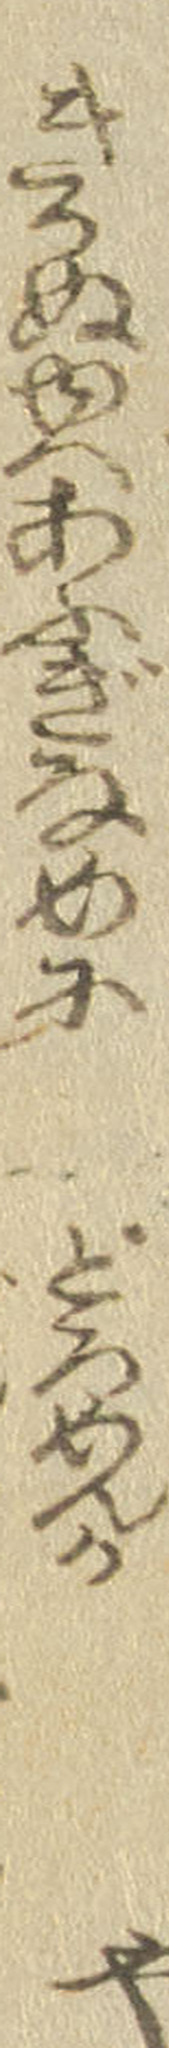きかぬゆへあふぎなめに
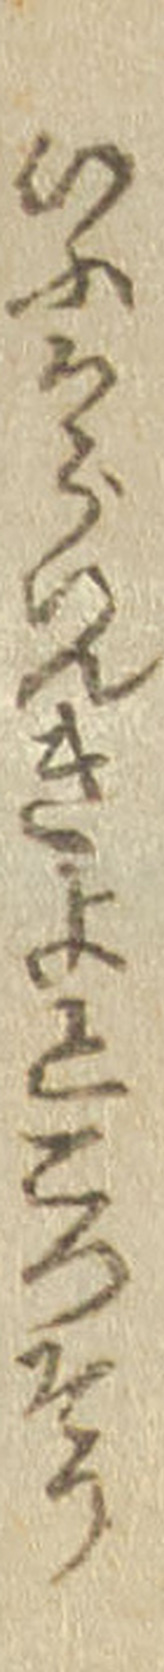いふからいんきよとこつそり
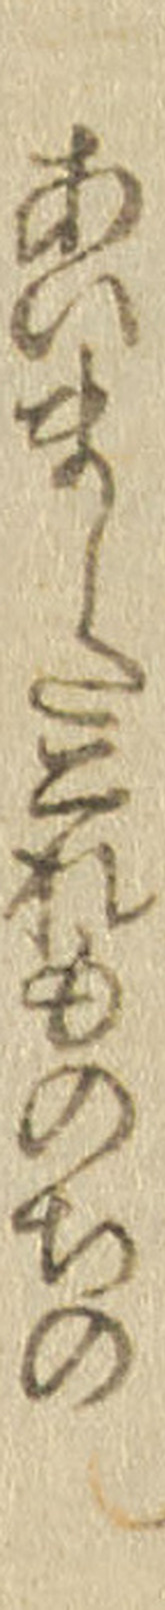あいましたこれものちの
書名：骨抜どうせうなまづ大家破焼
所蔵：東京大学総合図書館 General Library in the University of Tokyo, JAPAN
